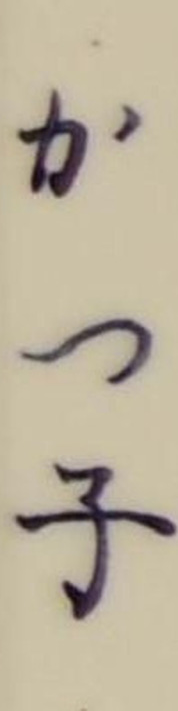かつ子

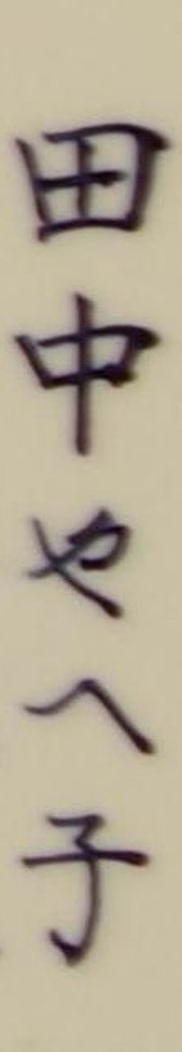田中やへ子
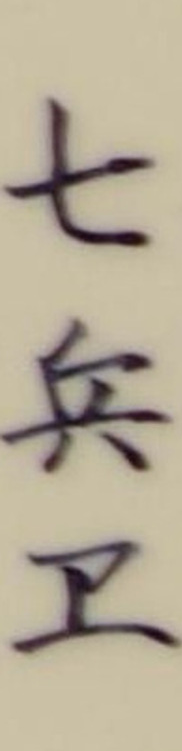七兵ヱ
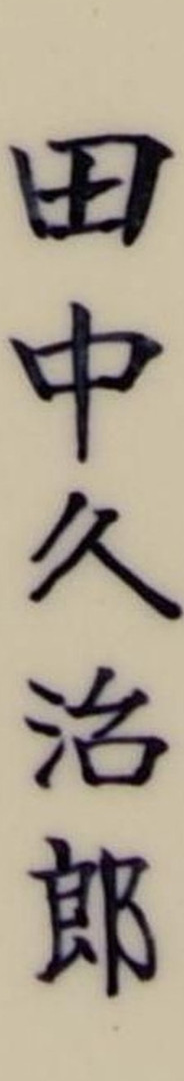田中久治郎
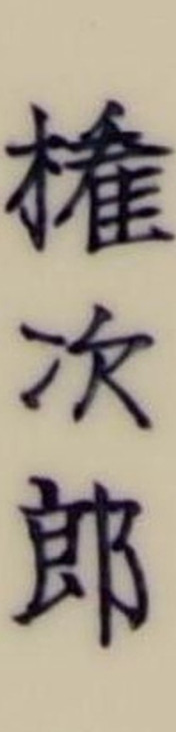権次郎
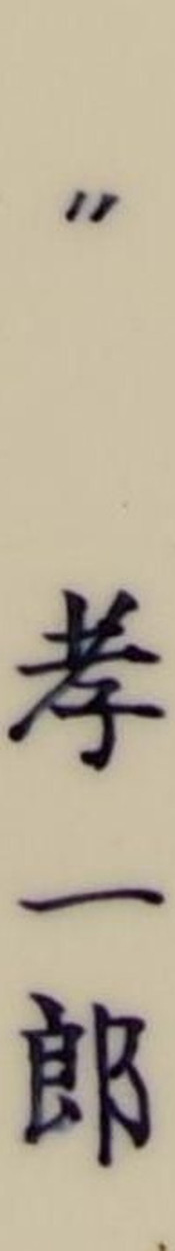孝一郎
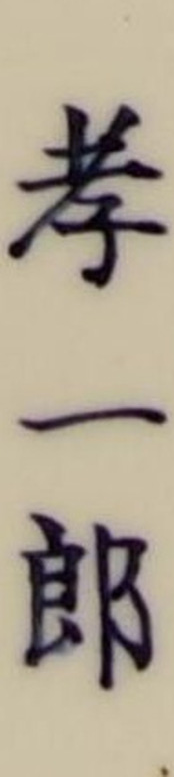孝一郎
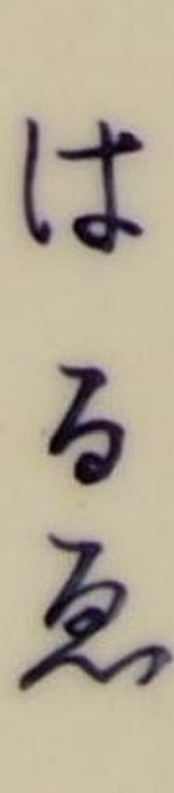はるゑ
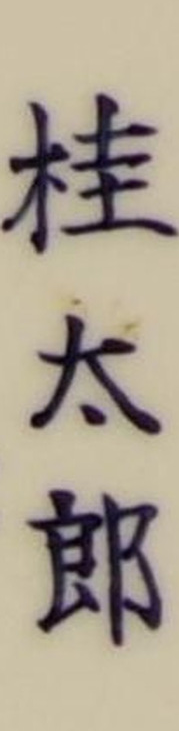桂太郎
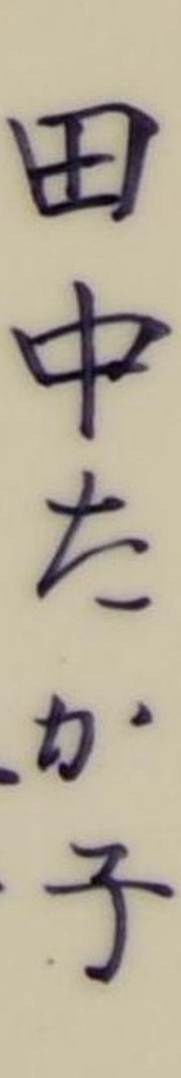田中たか子

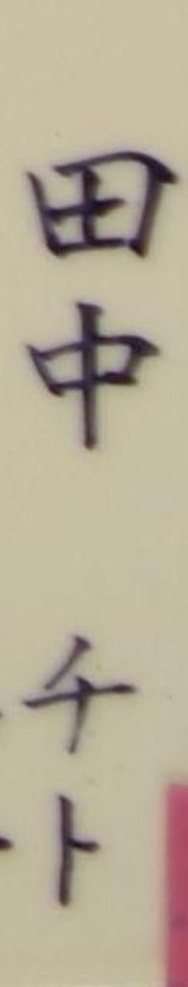田中チト
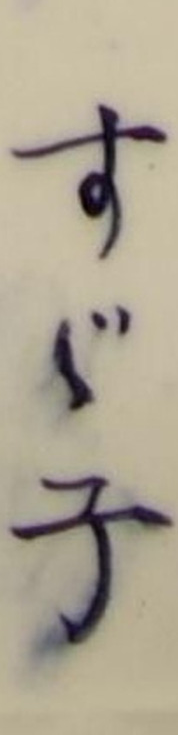すず子
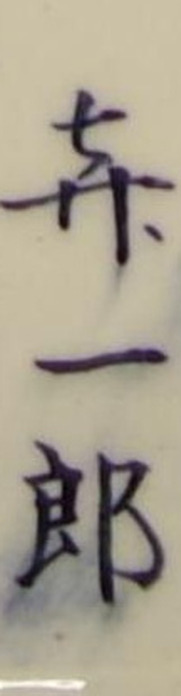喜一郎
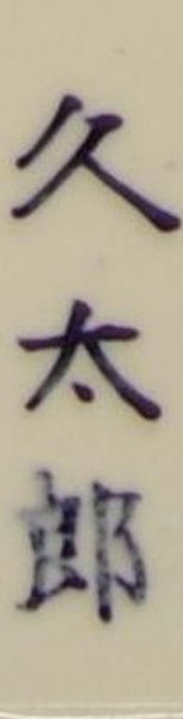久太郎
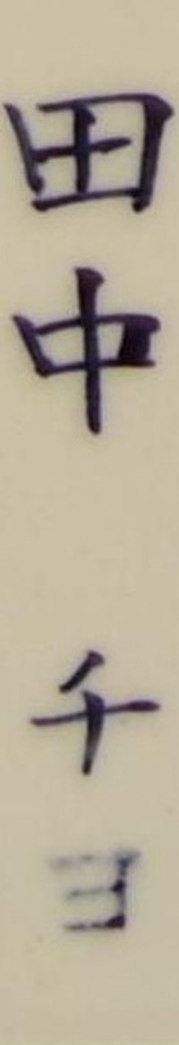田中チヨ
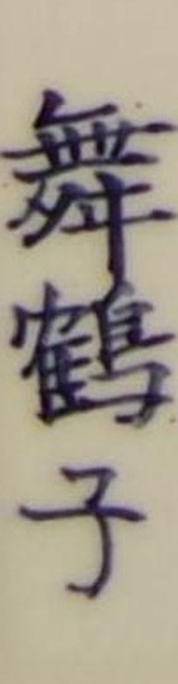舞鶴子
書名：A~D
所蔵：koyasan kongobuji
